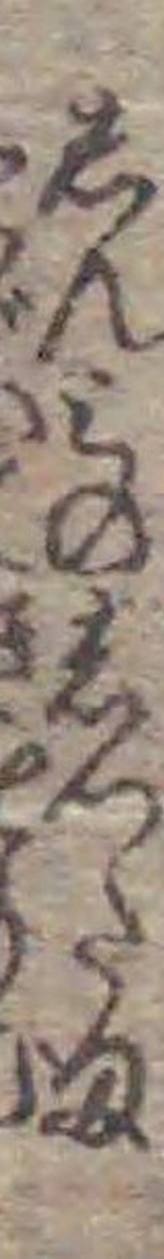しんみのしつたま
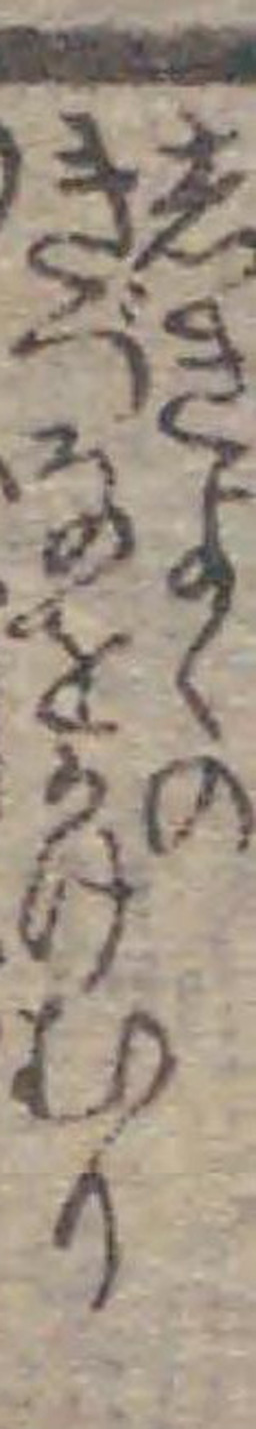きづなをかけむり
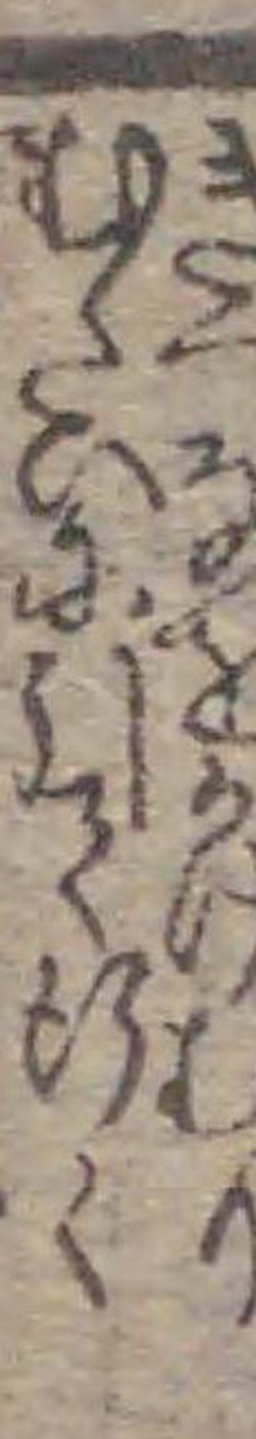むたいに引て行く
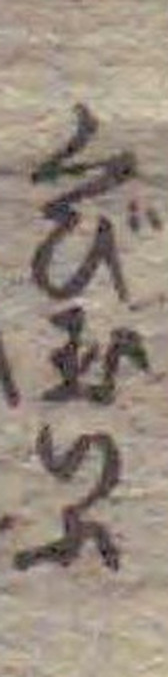くび玉いふ
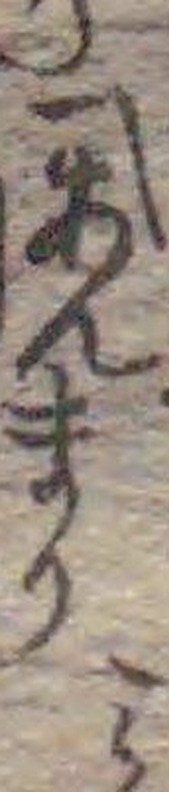〽あんまり
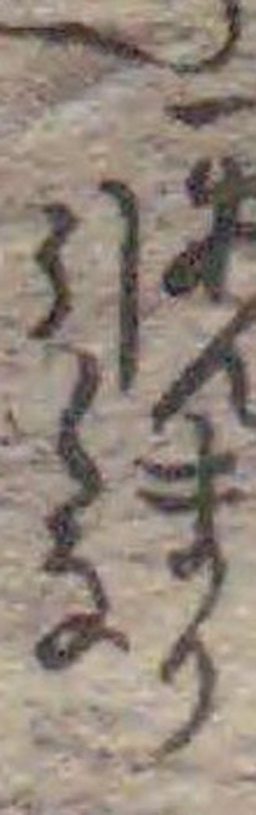引くな
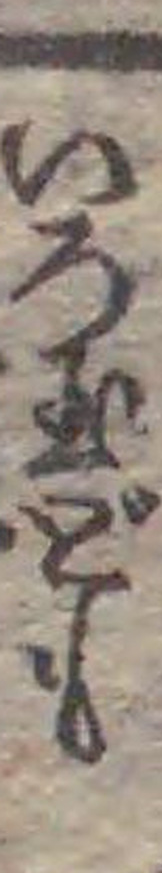いろ玉ども
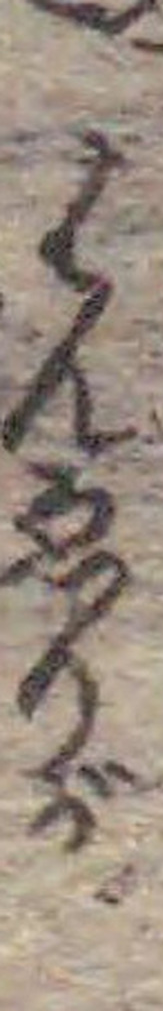はんゑりが
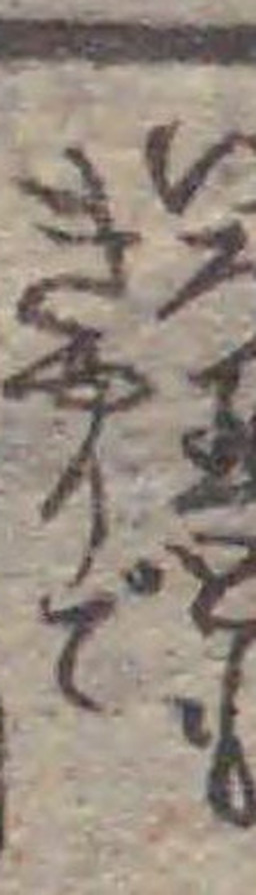きやりで
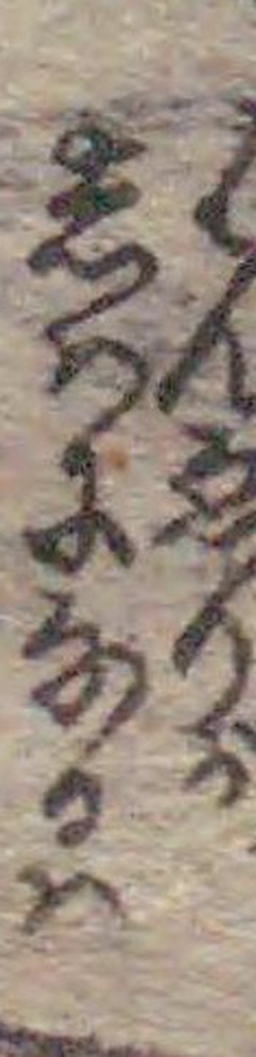しはになるは
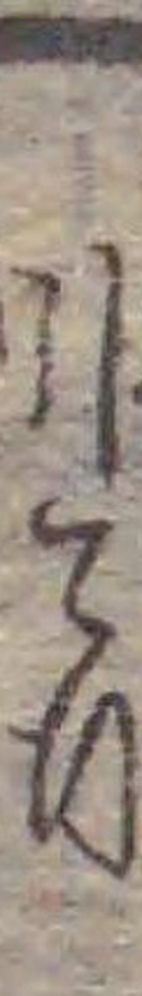引て行
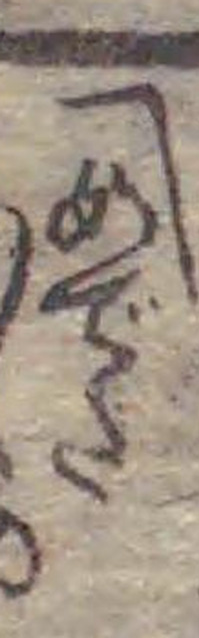〽めでた
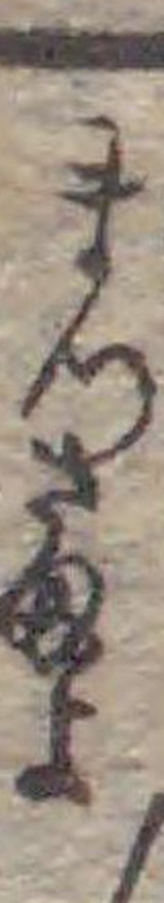まつさまよ
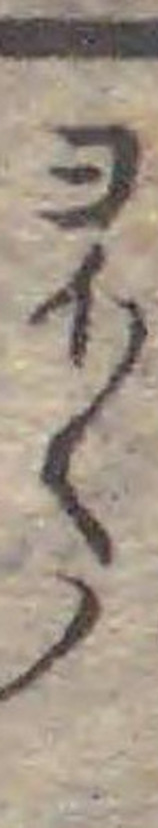ヨイ〳〵ノ
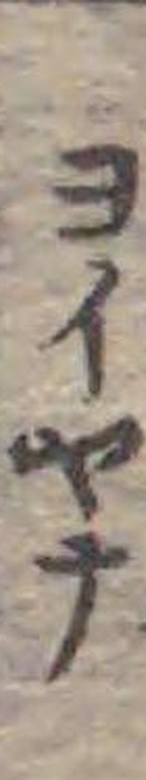ヨイヤナ

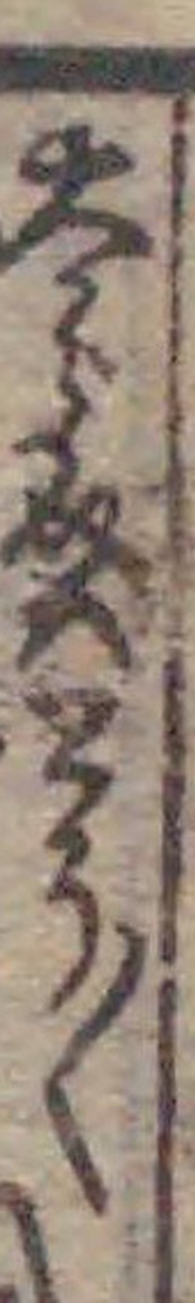太郎介はとう〳〵
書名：四遍搨心学草帋 : 3巻
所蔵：国立国会図書館 National Diet Library, JAPAN
